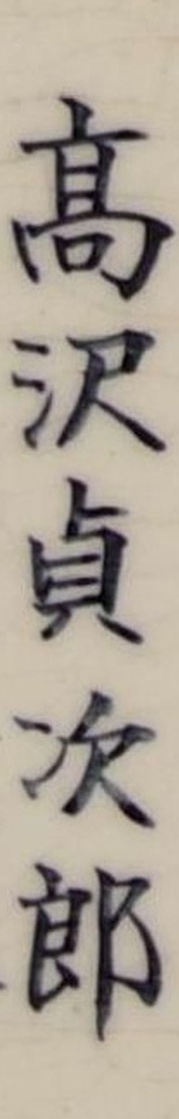高沢貞次郎
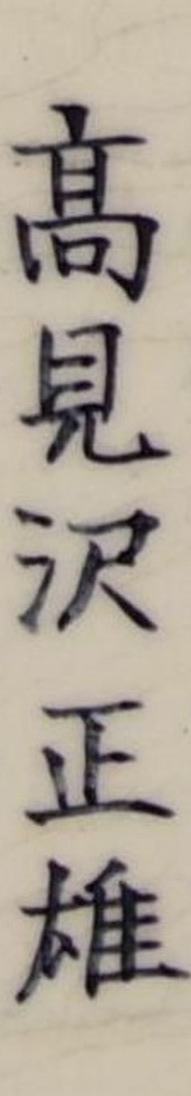高見沢正雄
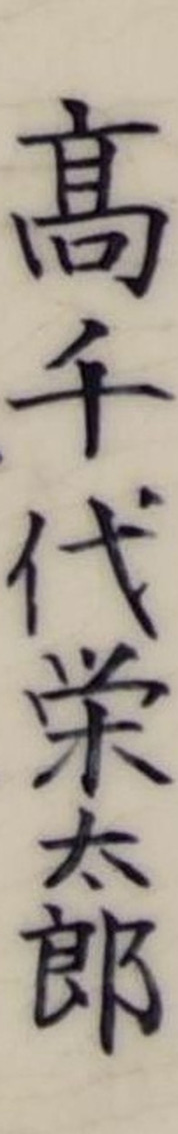高千代栄太郎
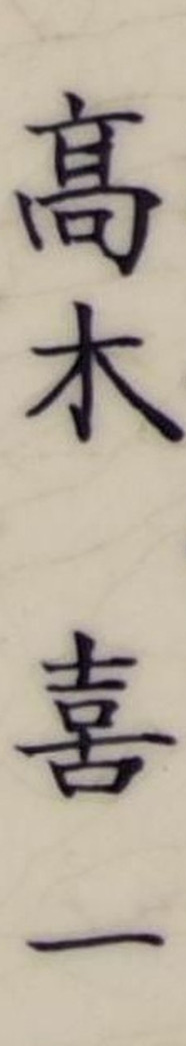高木喜一
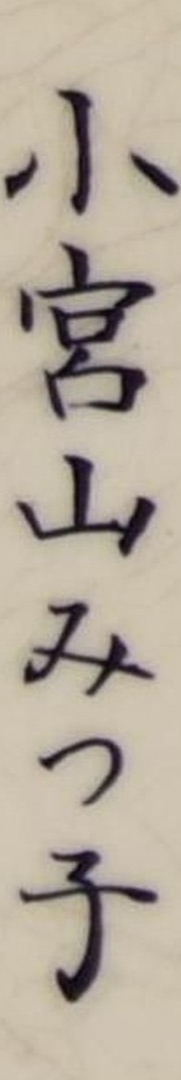小宮山みつ子
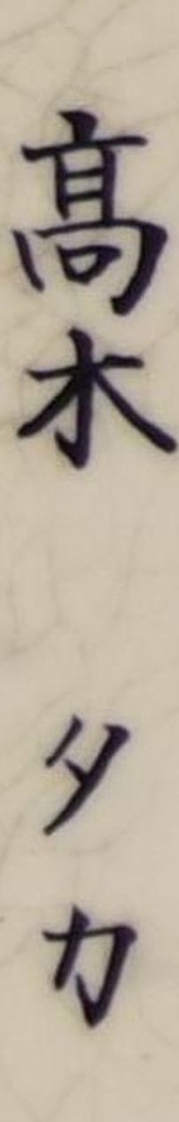高木タカ

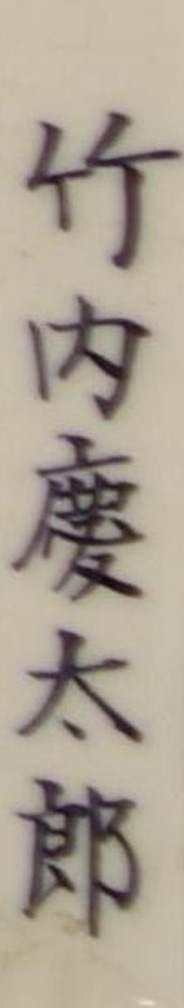竹内慶太郎
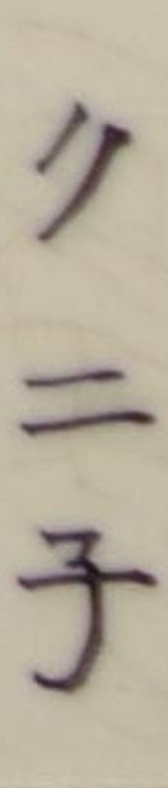ク二子
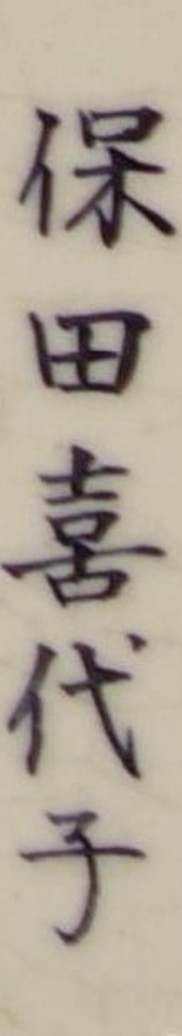保田喜代子
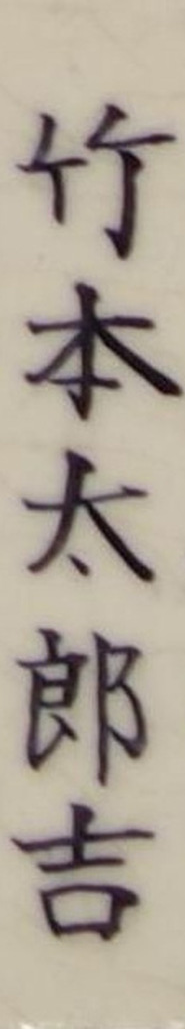竹本太郎吉
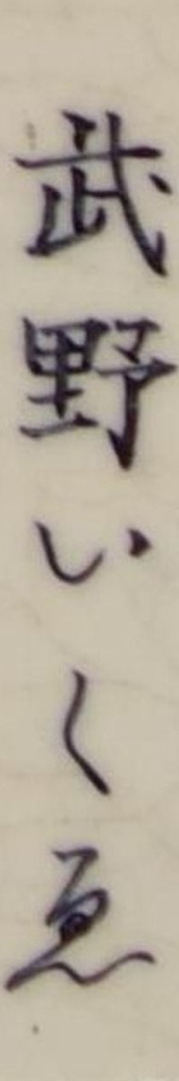武野いくえ
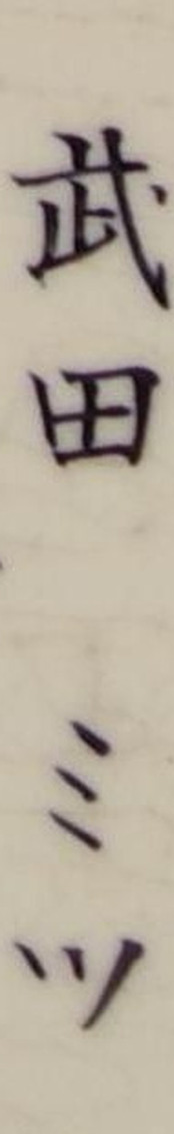武田ミツ
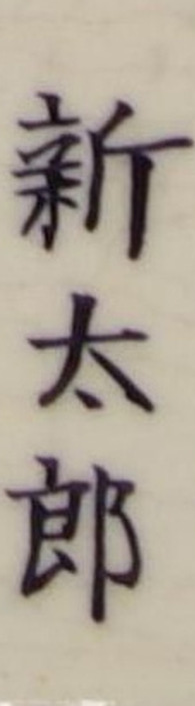新太郎
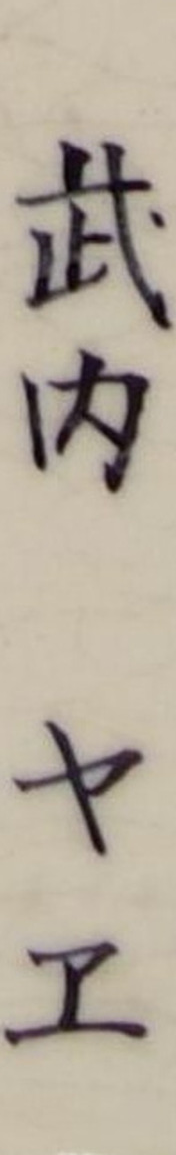武内ヤエ
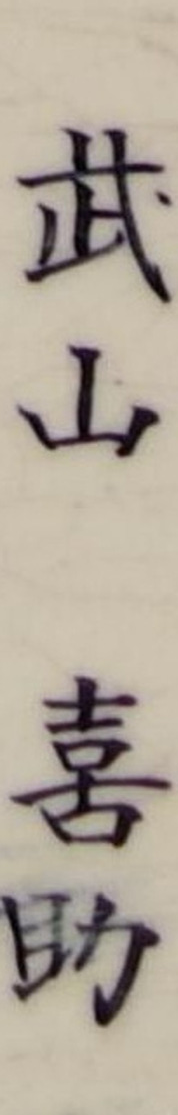武山喜助
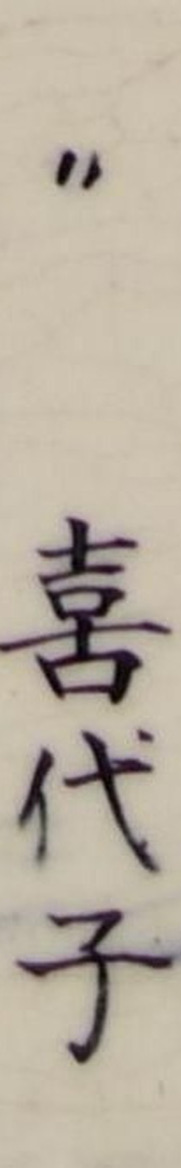喜代子
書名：E~L
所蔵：高野山金剛峯寺
